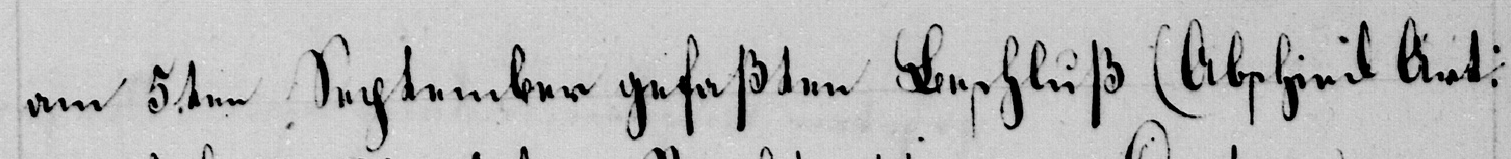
am 5ten September gefaßten Beschluß (Abschied Art:
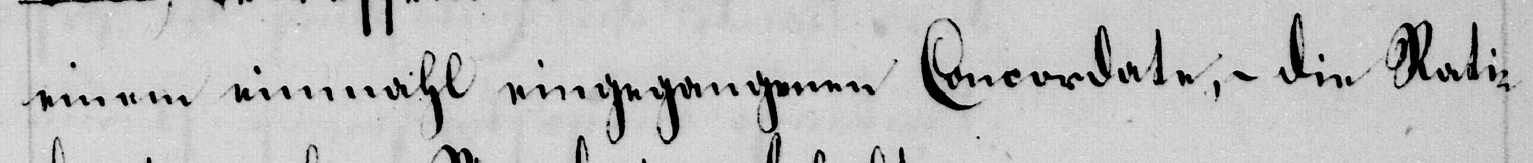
einem einmahl eingegangenen Concordate, – die Rati¬
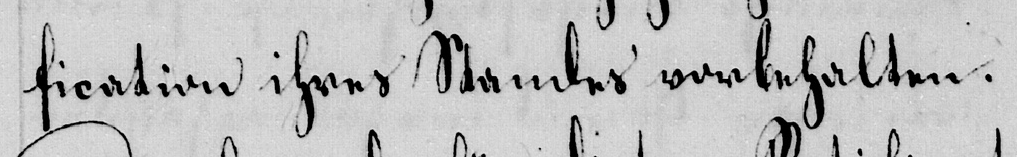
fication ihres Standes vorbehalten.
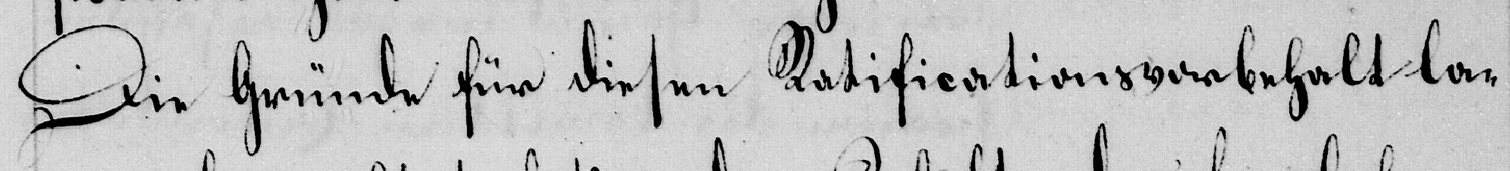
Die Gründe für diesen Ratificationsvorbehalt la¬
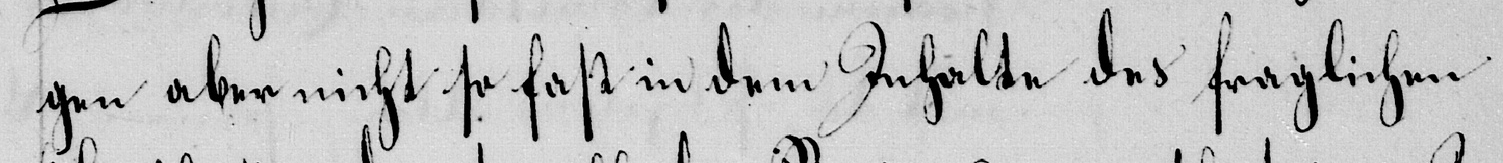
gen aber nicht so fast in dem Inhalte des fraglichen
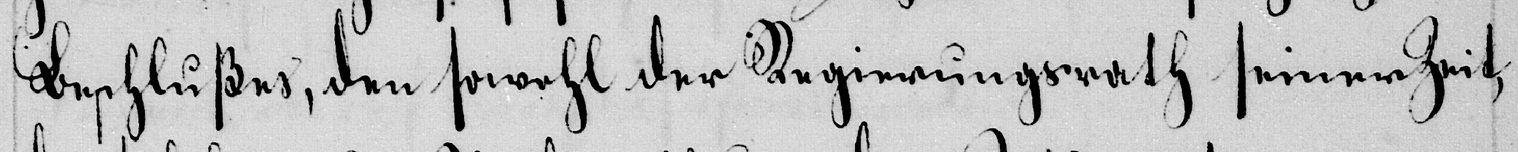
Beschlußes, den sowohl der Regierungsrath seiner Zeit,
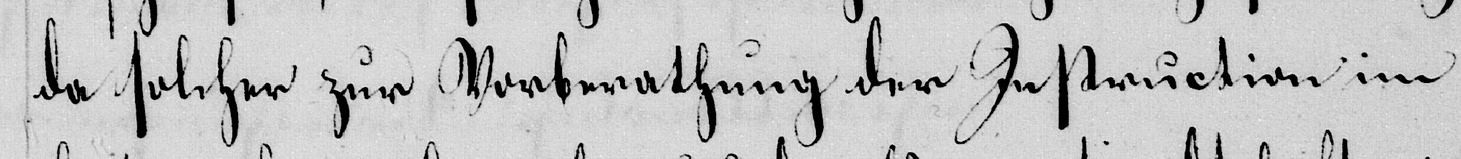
da solcher zur Vorberathung der Instruction im
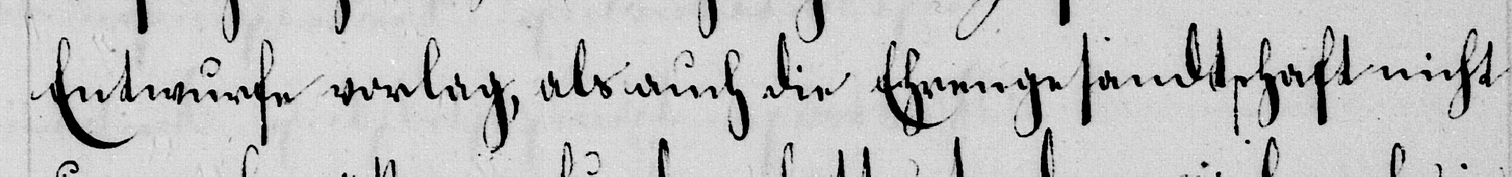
Entwurfe vorlag, als auch die Ehrengesandtschaft nicht
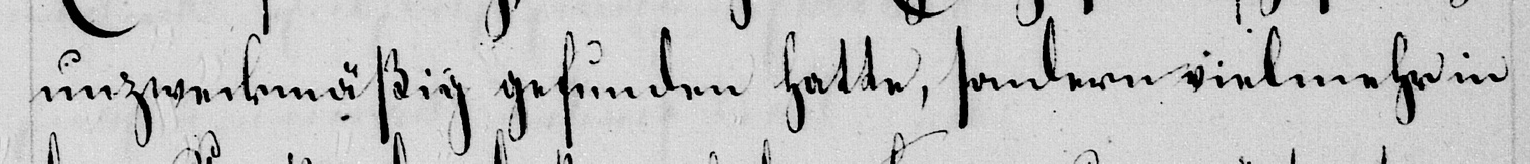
unzweckmäßig gefunden hatte, sondern vielmehr in
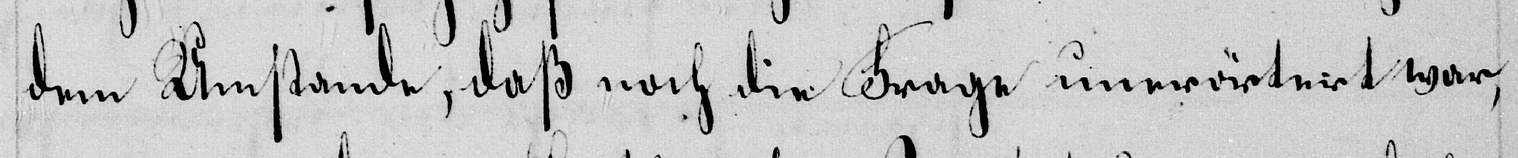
dem Umstande, daß die Frage unerörtert war,
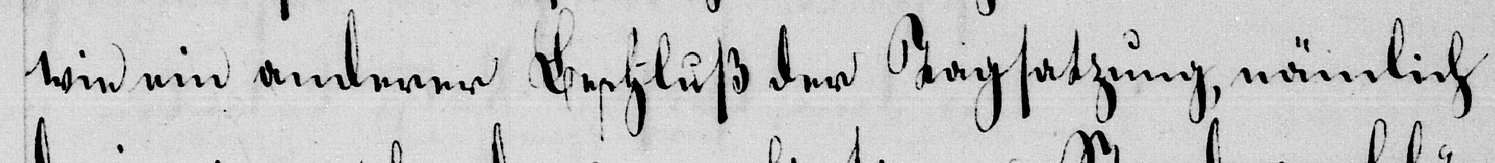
wie ein anderer Beschluß der Tagsatzung, nämlich
